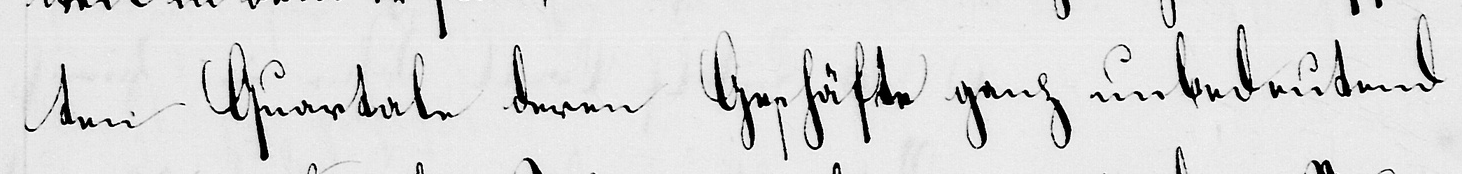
ten Quartale deren Geschäfte ganz unbedeutend
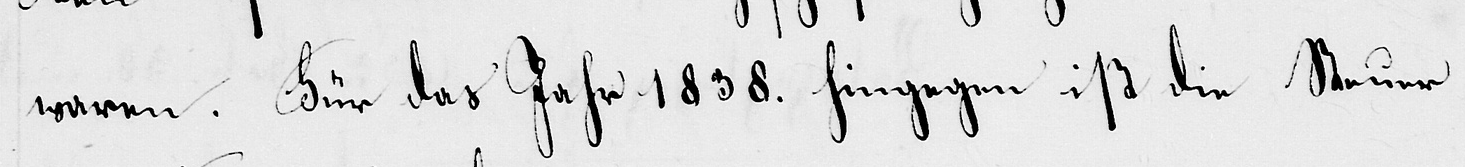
waren. Für das Jahr 1838. hingegen ist die Steuer
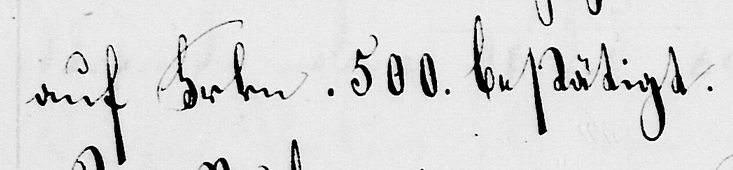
auf Frkn. 500. bestätigt.
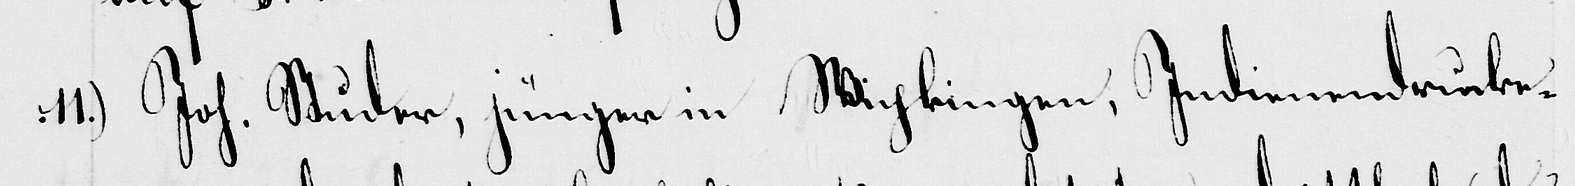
11.) Joh. Studer, jünger in Wipkingen, Indienendrucke¬
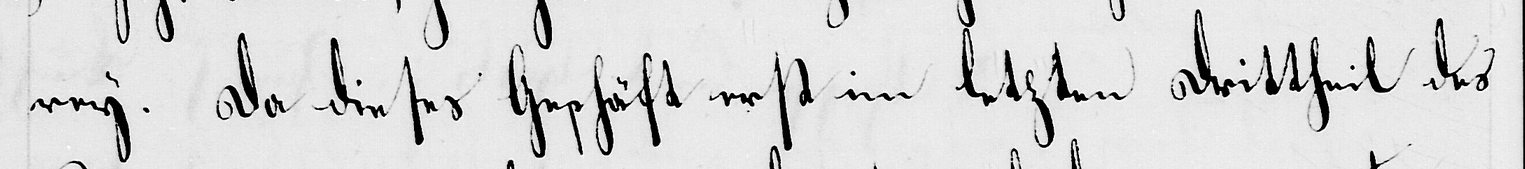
rey. Da dieses Geschäft erst im letzten Drittheil des
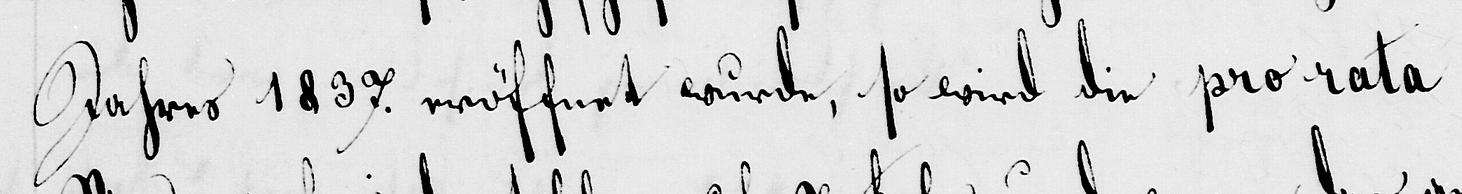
Jahres 1837. eröffnet wurde, so wird die pro rata
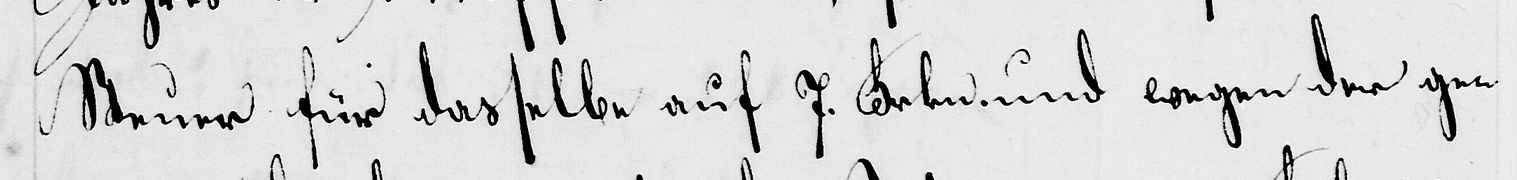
Steuer für dasselbe auf 7. Frkn. und wegen der ge¬
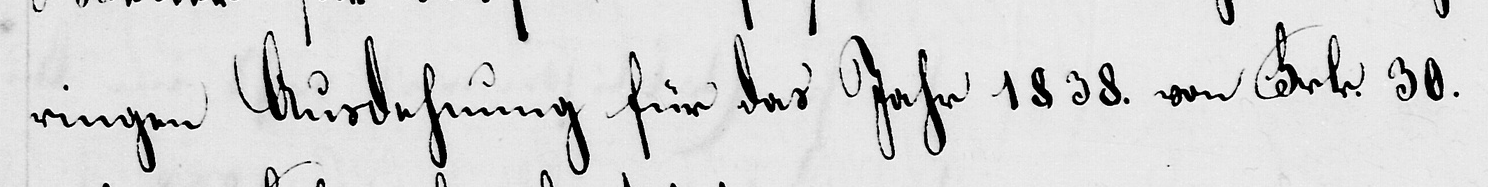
ringen Ausdehnung für das Jahr 1838. von Frk. 30.
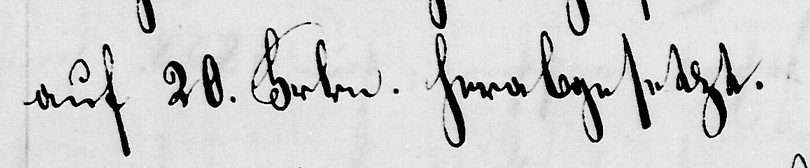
auf 20. Frkn. herabgesetzt.
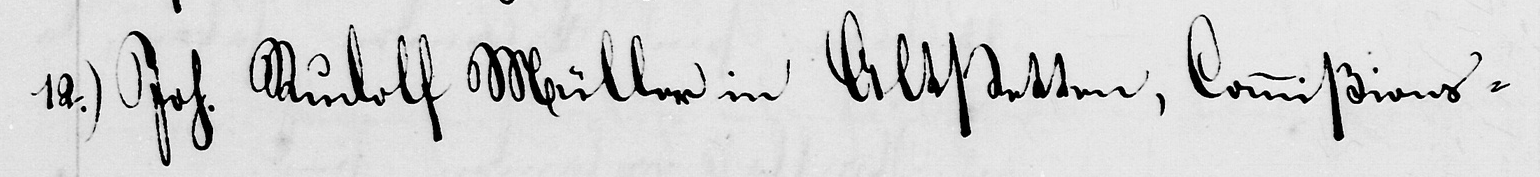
12.) Joh. Rudolf Müller in Altstetten, Commißions-
